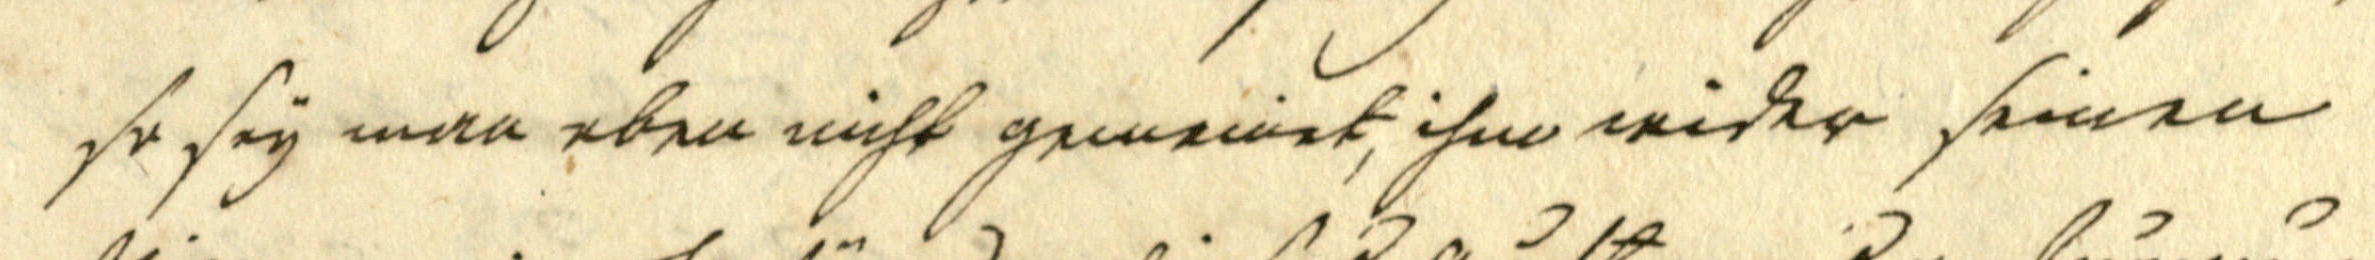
so seÿ man eben nicht gemeinet, ihm wider seinen
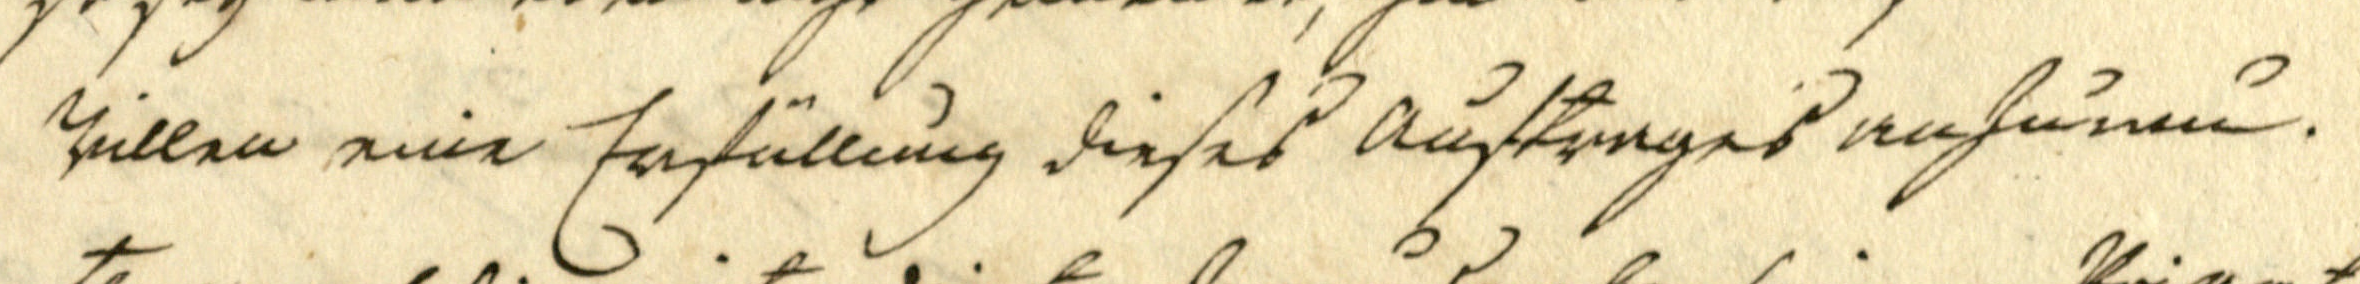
Willen eine Erfüllung dieses Auftrages anzumu¬
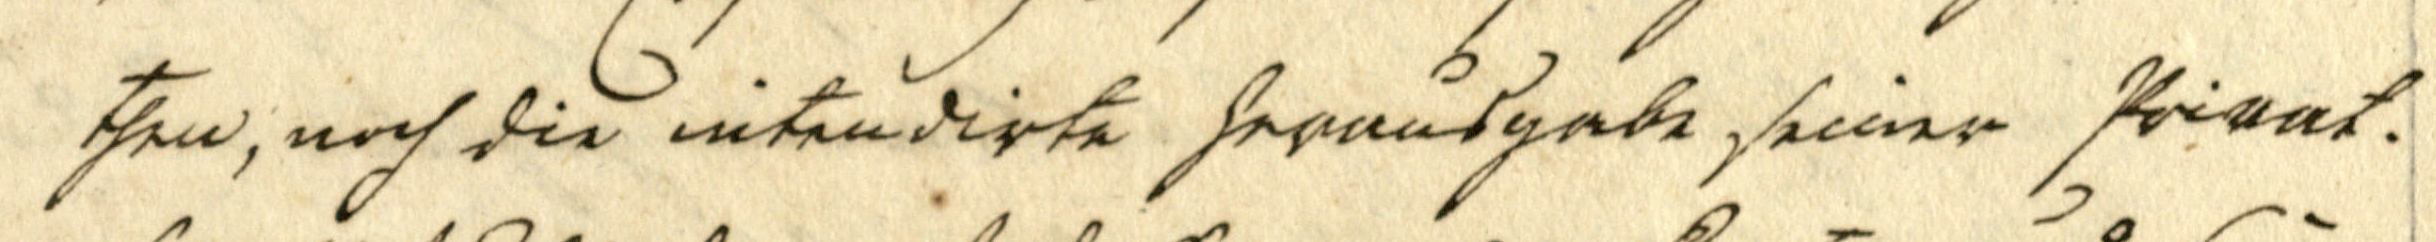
then, noch die intendirte Herausgabe seiner Privat¬
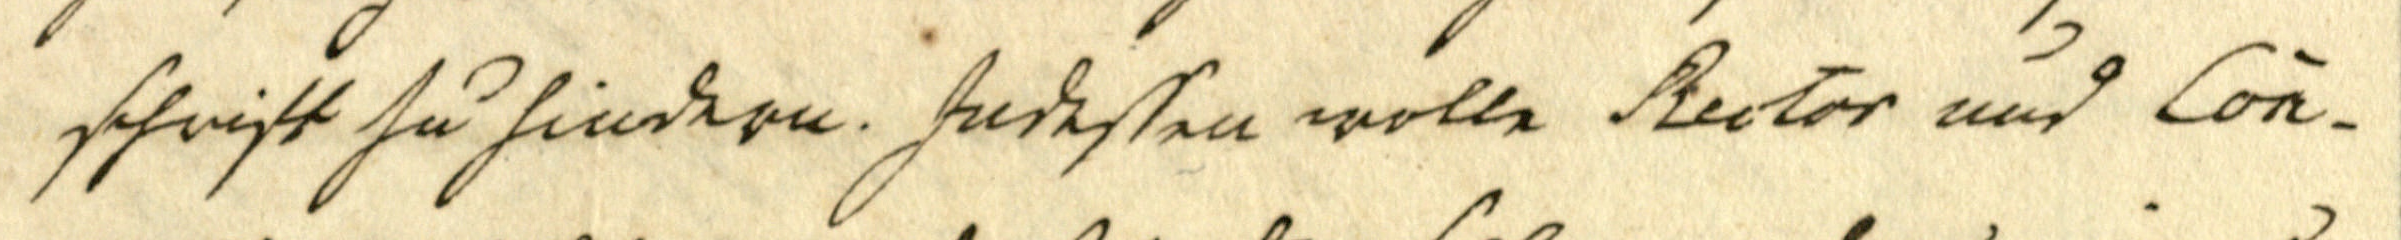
schrift zu hindern. Indessen wolle Rector und Con¬
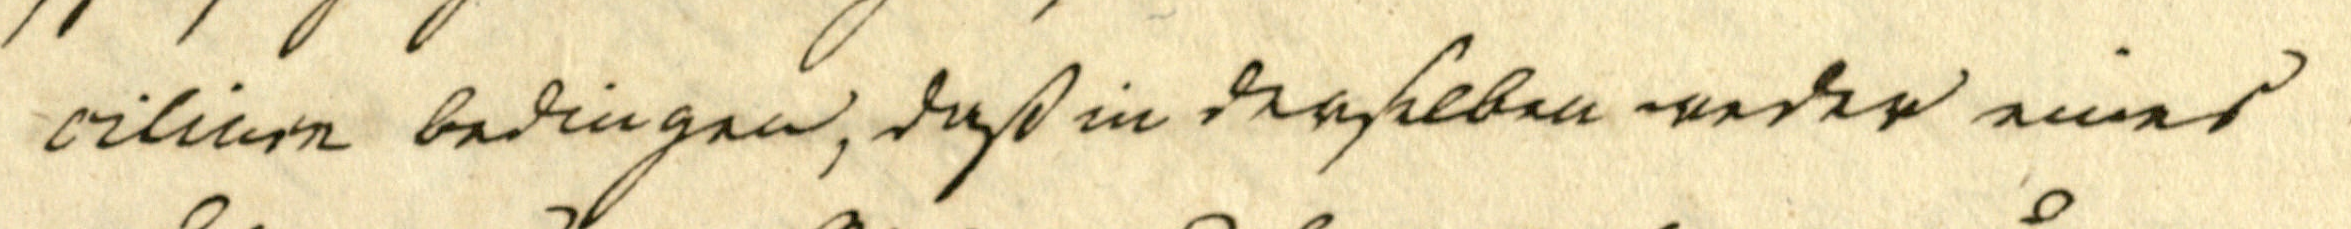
cilium bedingen, daß in derselben weder eines
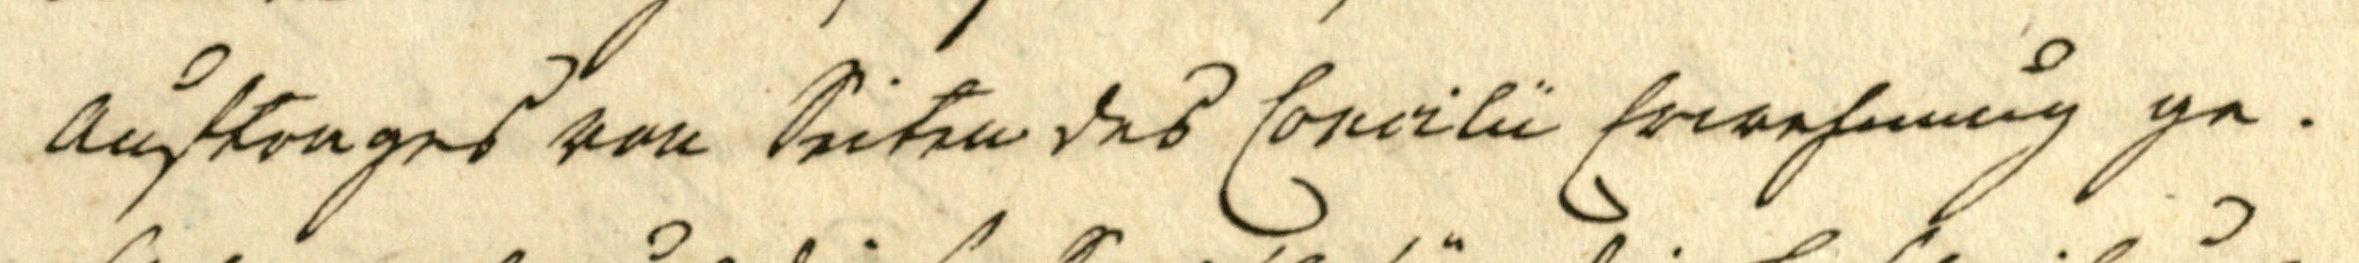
Auftrages von Seiten des Concilii Erwehnung ge¬
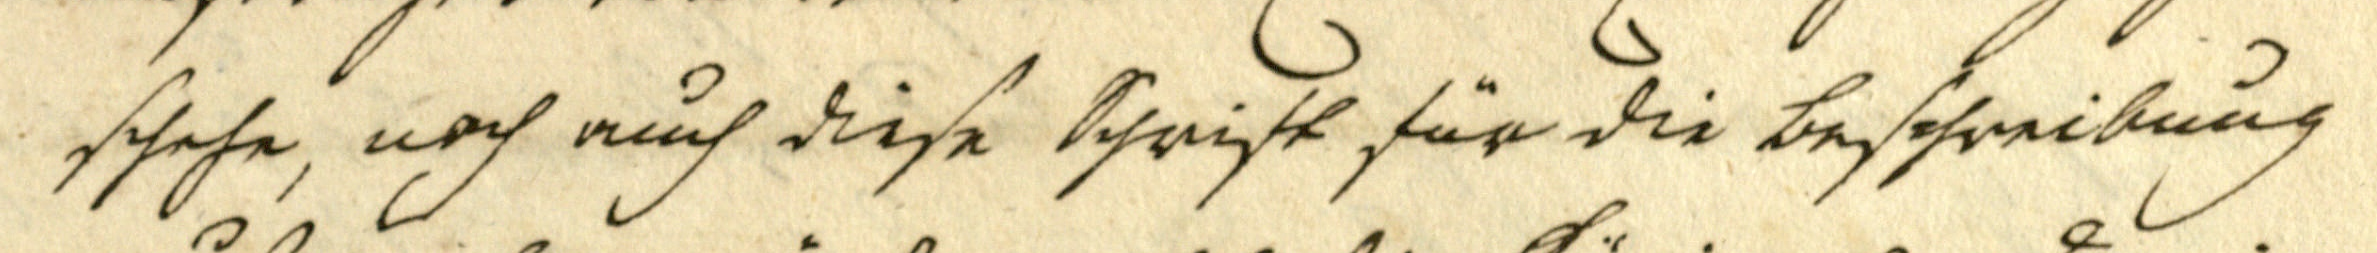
schehe, noch auch diese Schrift für die Beschreibung
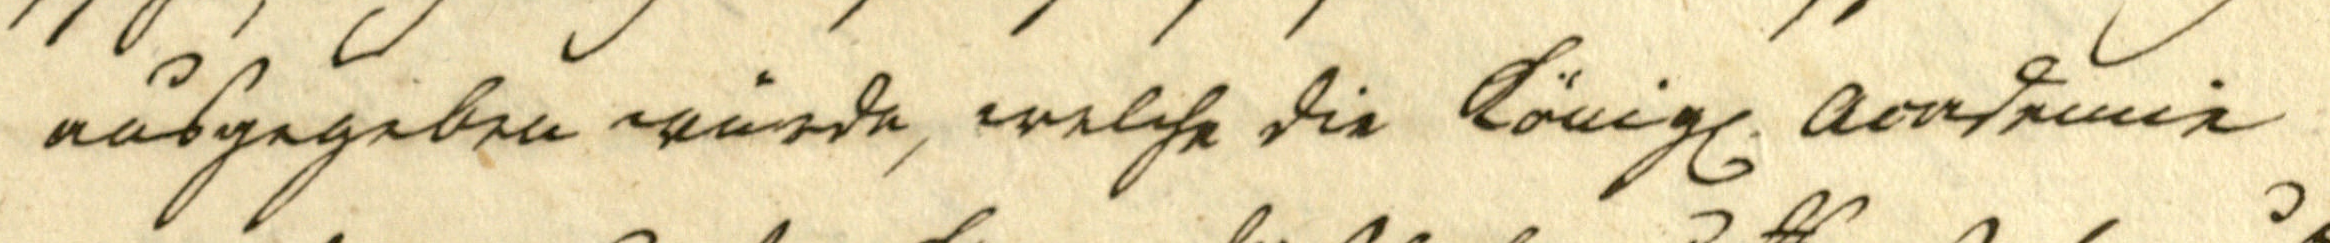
ausgegeben würde, welche die Königl. Academie
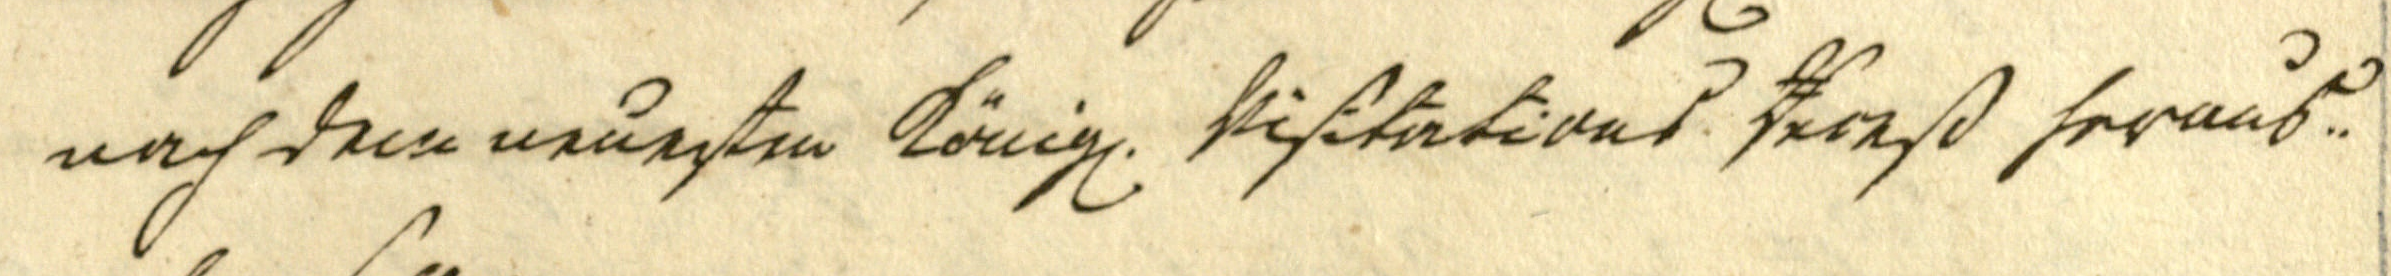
nach dem neuesten Königl. Visitations Receß heraus¬
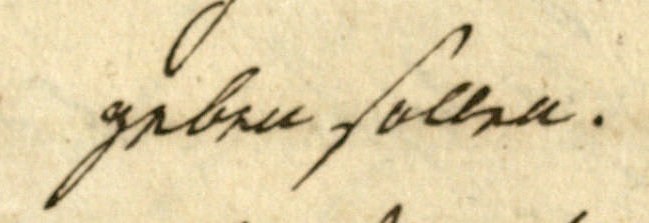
geben sollen.
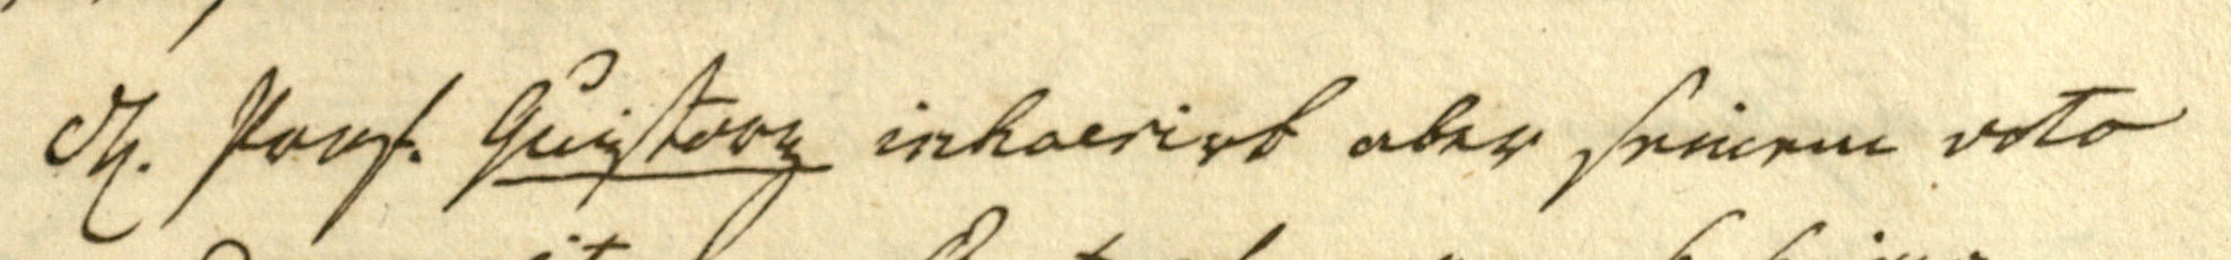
dh. Prof. Quistorp inhaerirt aber seinem voto
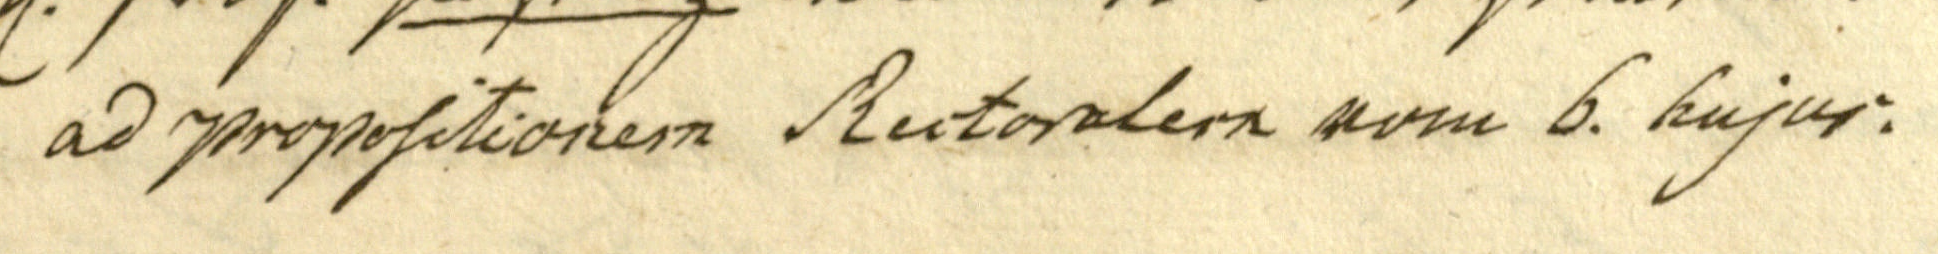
ad propositionem Rectoralem vom 6. hujus.
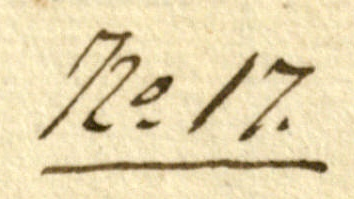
No 17.
